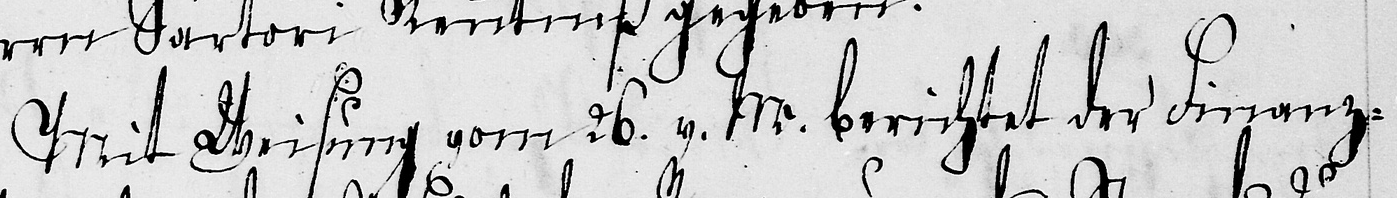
Mit Weisung vom 26. v. M. berichtet der Finanz¬
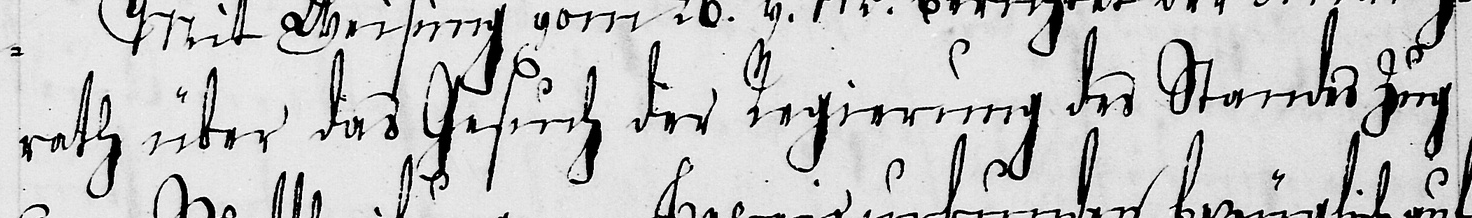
rath über das Gesuch der Regierung des Standes Zug
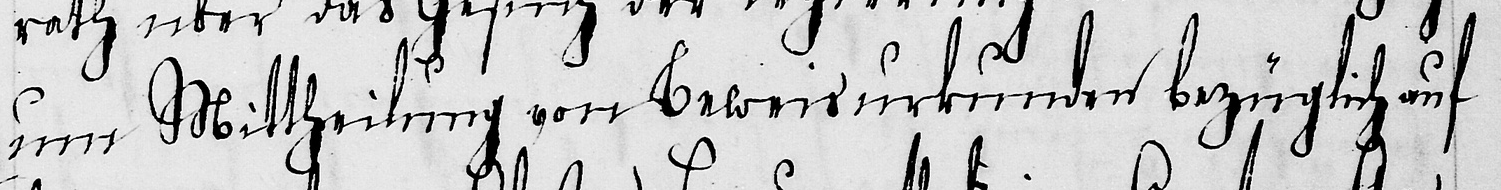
um Mittheilung von Beweisurkunden bezüglich auf
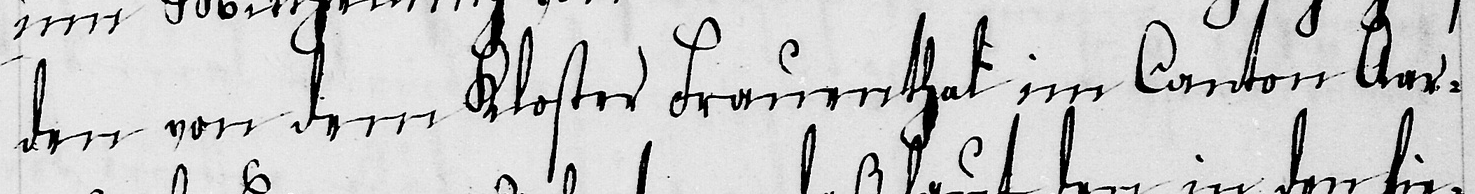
den von dem Kloster Frauenthal im Canton Aar¬
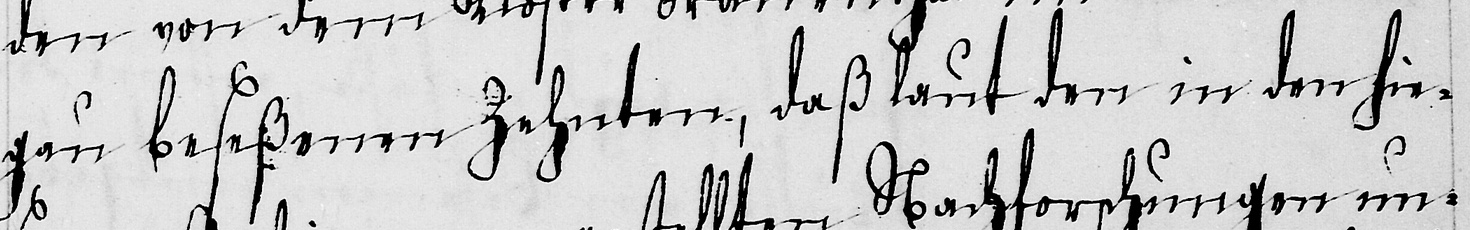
gau beseßenen Zehnten, daß laut den in den hie¬
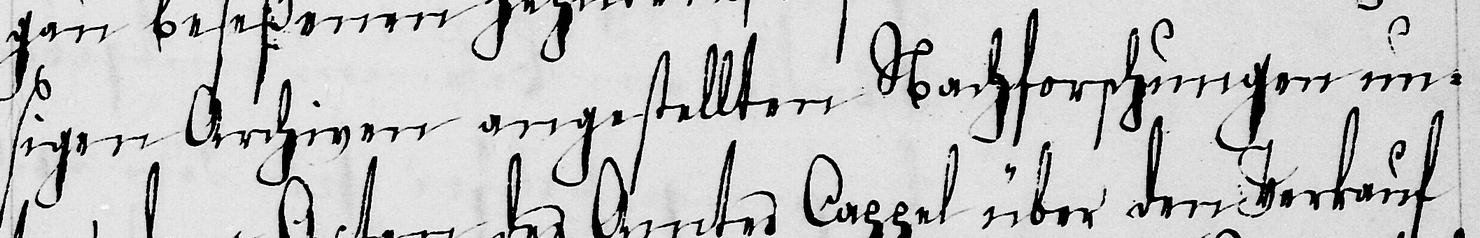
sigen Archiven angestellten Nachforschungen un¬
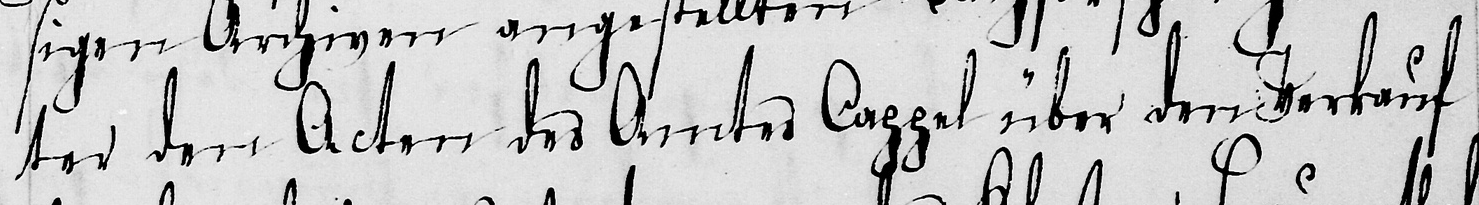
ter den Acten des Amtes Cappel über den Verkauf
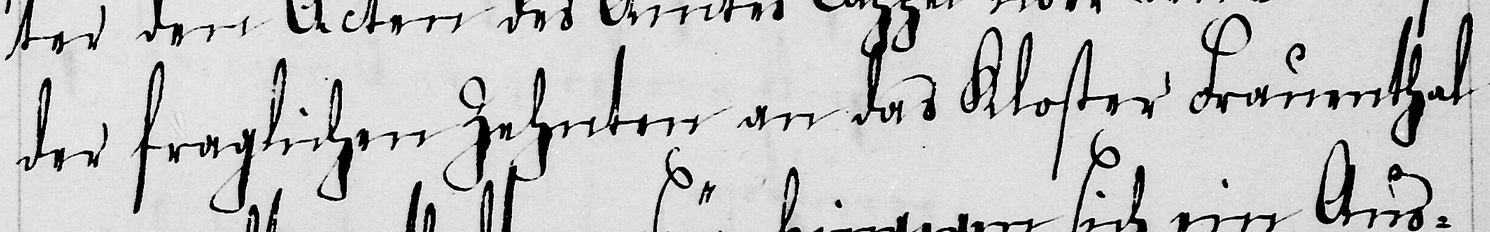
der fraglichen Zehnten an das Kloster Frauenthal
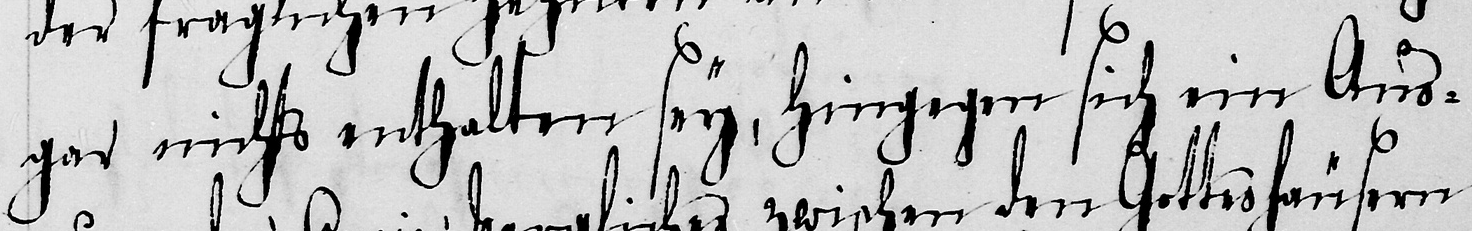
gar nichts enthalten sey, hingegen sich ein Aus¬
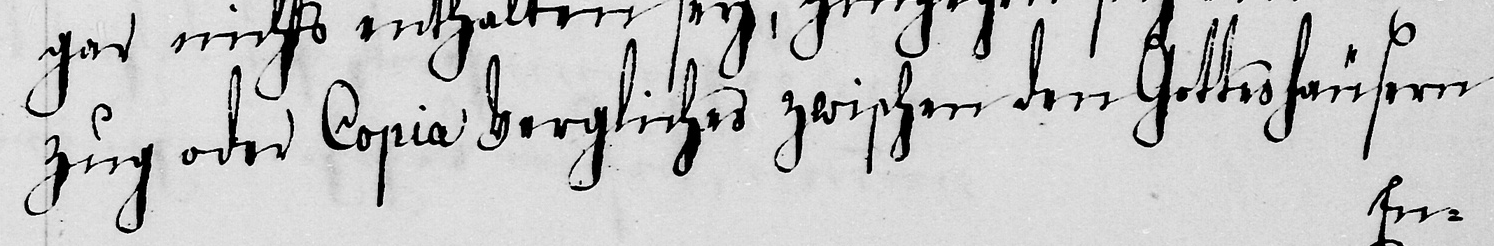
zug oder Copia Vergliches zwischen den Gotteshäusern
